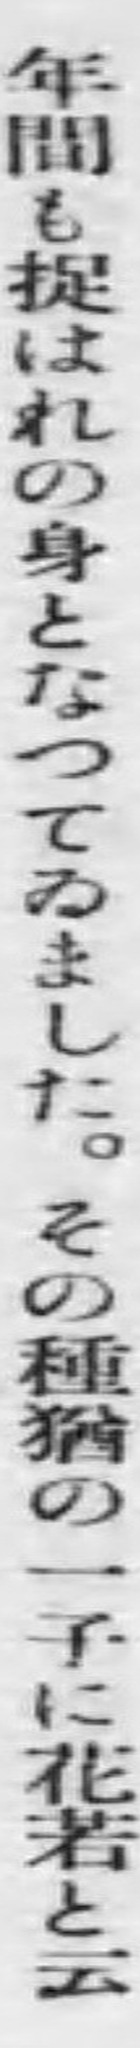年間も捉はれの身となつてゐました。その種猶の一子に花若と云
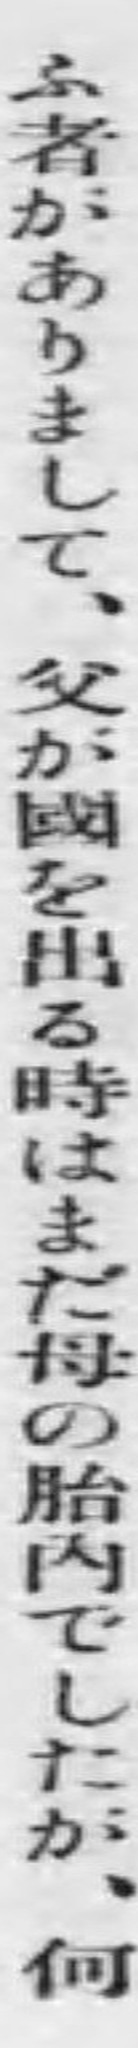ふ者がありまして、父が国を出る時はまだ母の胎内でしたが、何
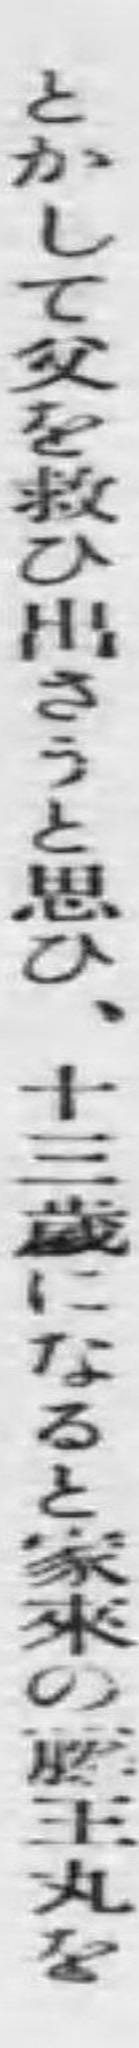とかして父を救ひ出さうと思ひ、十三歳になると家来の藤王丸を
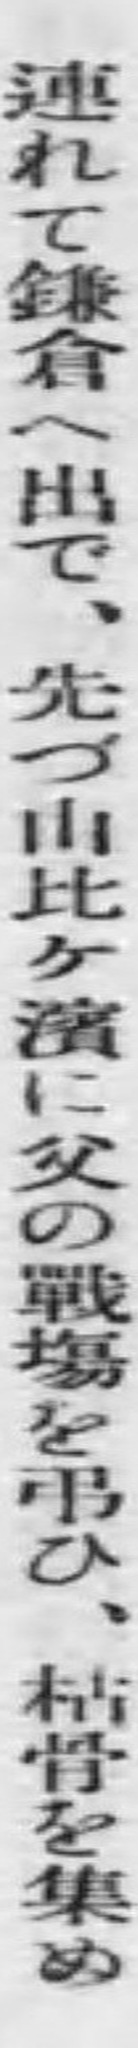連れて鎌倉へ出で、先づ由比ヶ浜に父の戦場を弔ひ、枯骨を集め
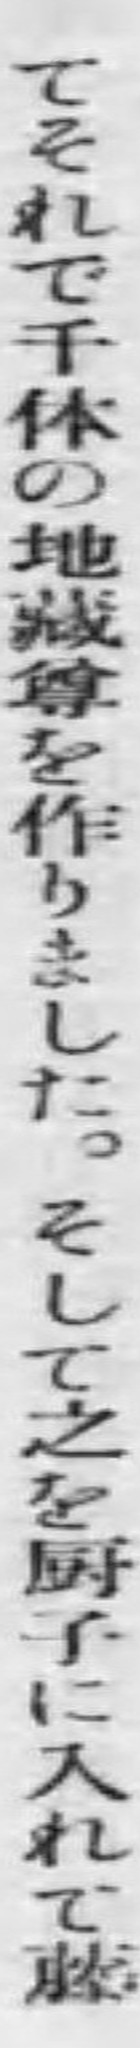てそれで千体の地蔵尊を作りました。そして之を厨子に入れて藤
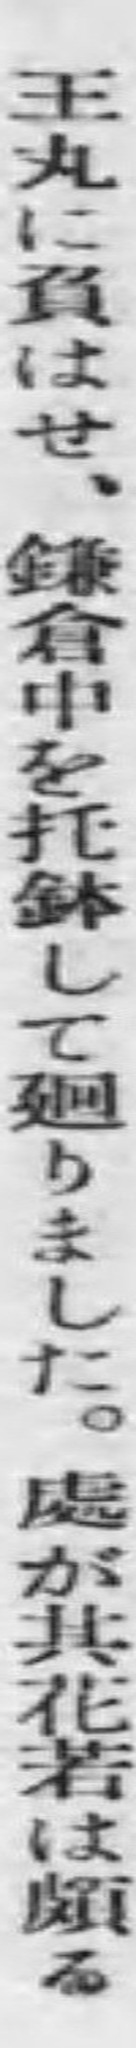王丸に負はせ、鎌倉中を托鉢して廻りました。処が其花若は頗る
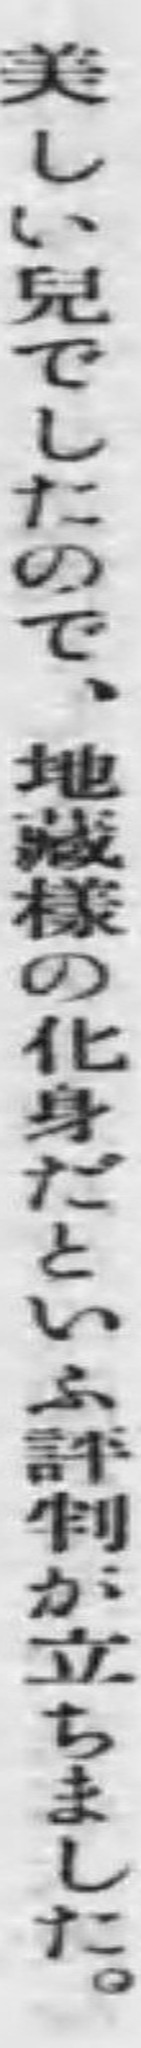美しい児でしたので、地蔵様の化身だといふ評判が立ちました。
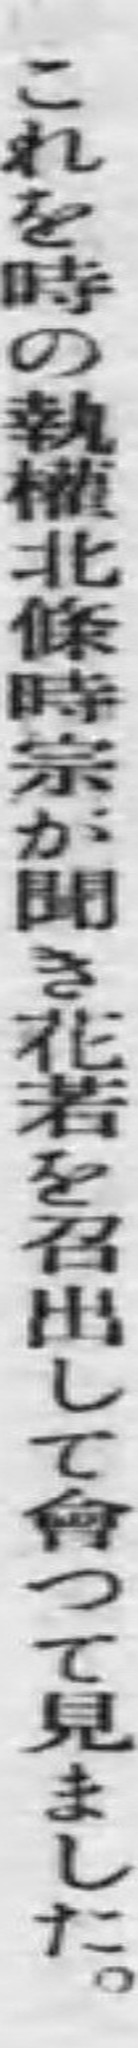これを時の執権北条時宗が聞き花若を召出して会つて見ました。
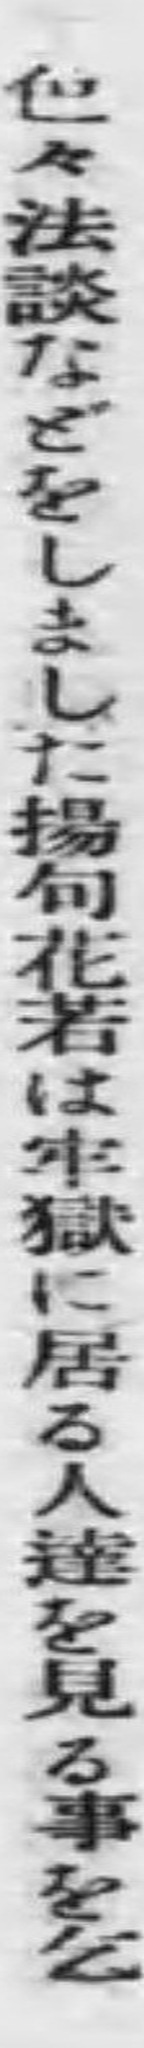色々法談などをしました揚句花若は牢獄に居る人達を見る事を乞
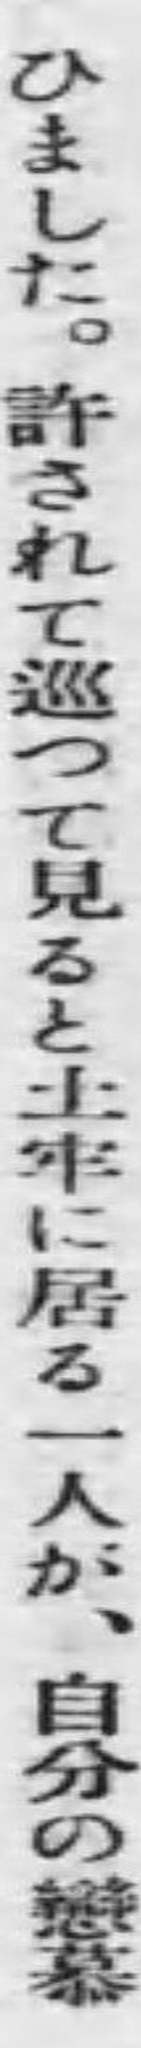ひました。許されて巡つて見ると土牢に居る一人が、自分の恋慕
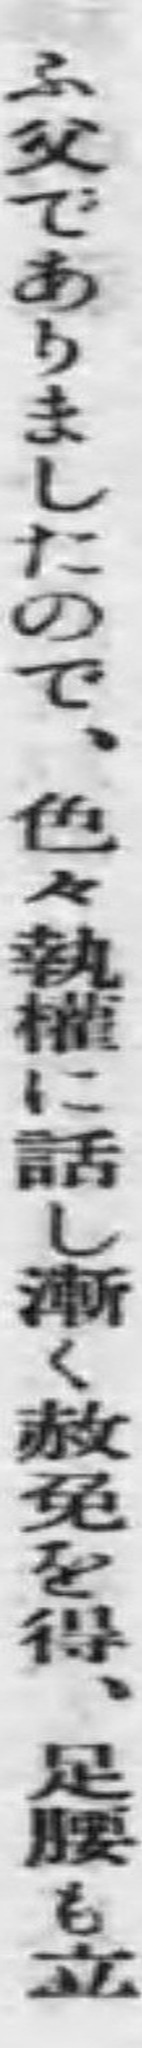ふ父でありましたので、色々執権に話し漸く赦免を得、足腰も立
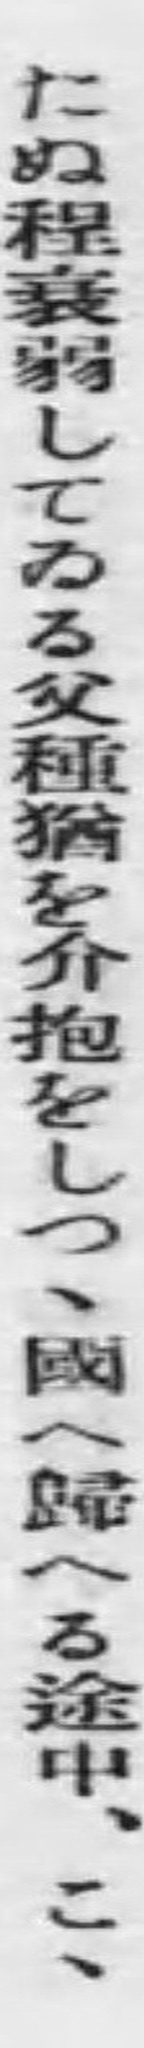たぬ程衰弱してゐる父種猶を介抱をしつゝ国へ帰へる途中、こゝ
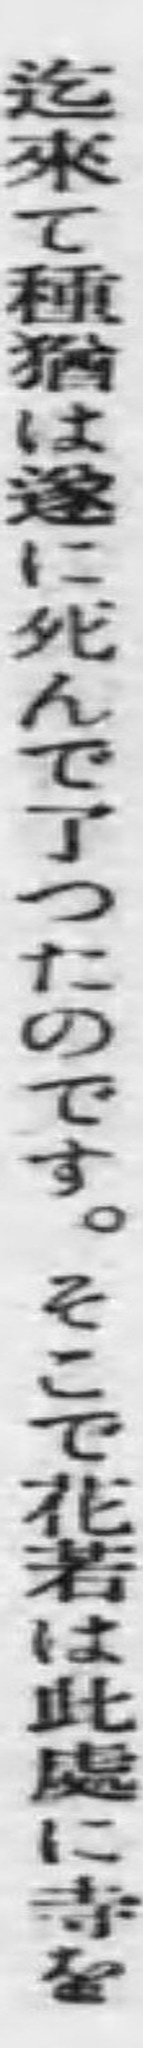迄来て種猶は遂に死んで了つたのです。そこで花若は此処に寺を
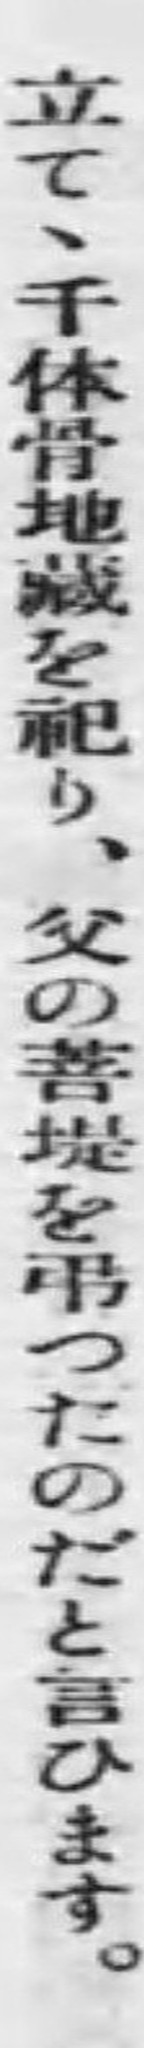立てゝ千体骨地蔵を祀り、父の菩堤を弔つたのだと言ひます。
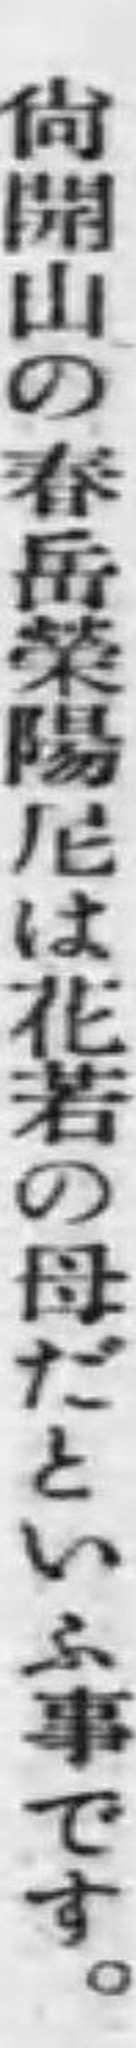尚開山の春岳栄陽尼は花若の母だという事です。
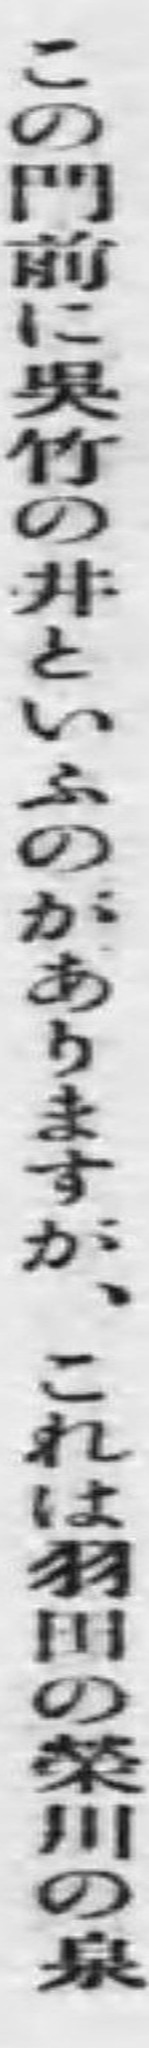この門前に呉竹の井といふのがありますが、これは羽田の栄川の泉
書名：東三河道中記 : 豊橋市及其附近案内
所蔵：国立国会図書館 National Diet Library, JAPAN
